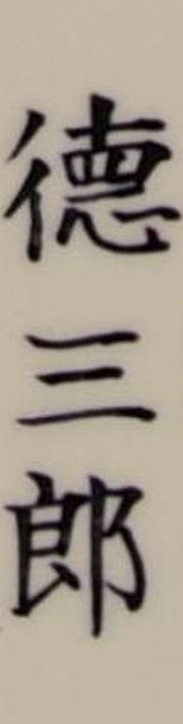徳三郎
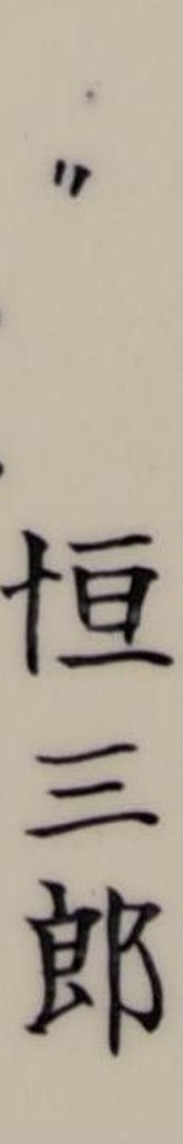恒三郎
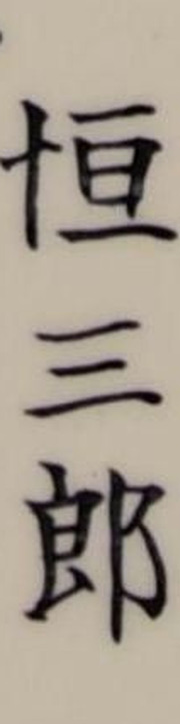恒三郎
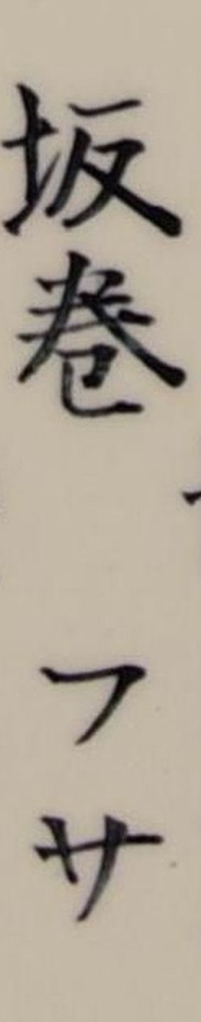坂巻フサ
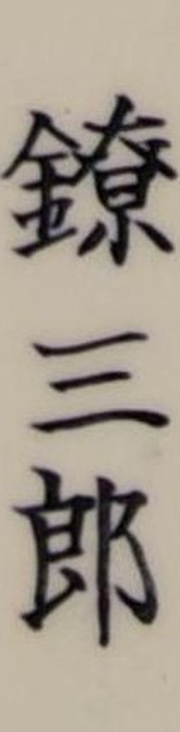鐐三郎
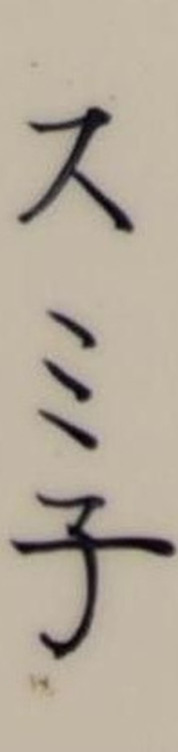スミ子
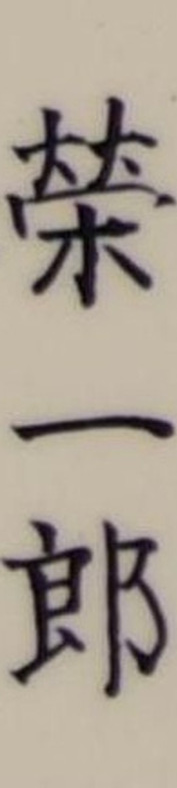榮一郎

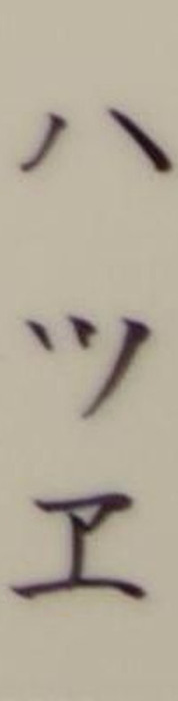ハツエ
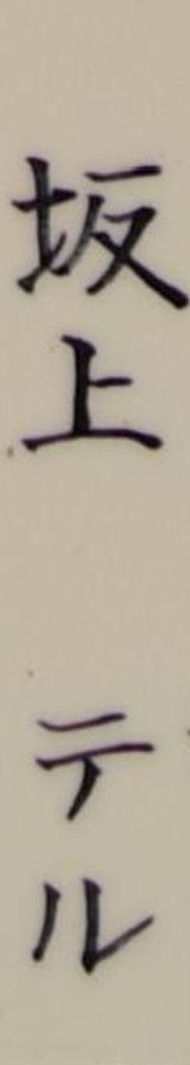坂上テル
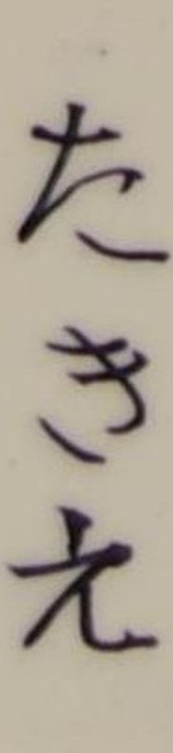たきえ
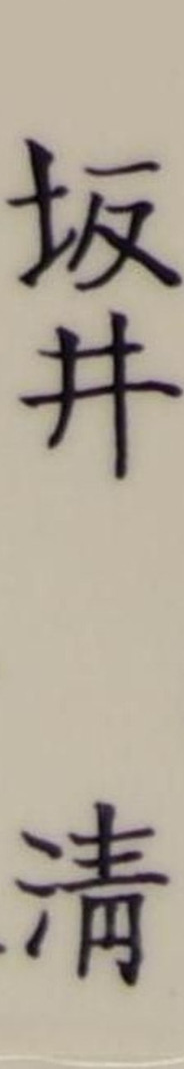坂井清
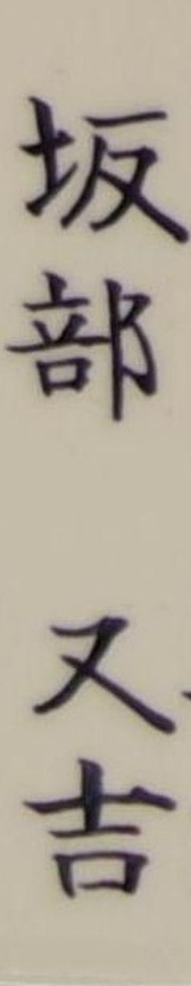坂部又吉

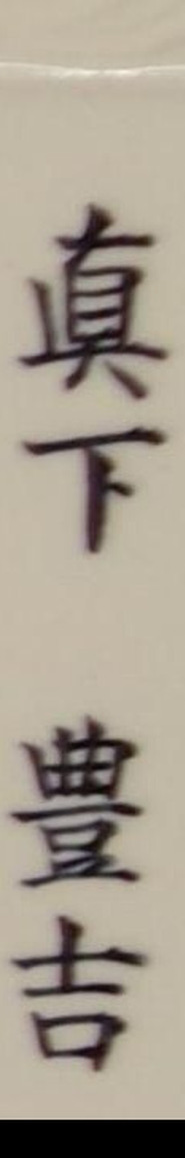真下豊吉
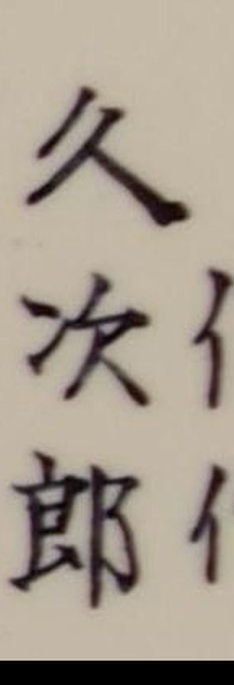久次郎
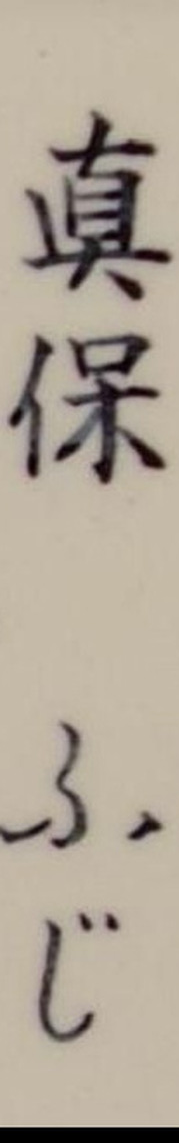真保ふじ
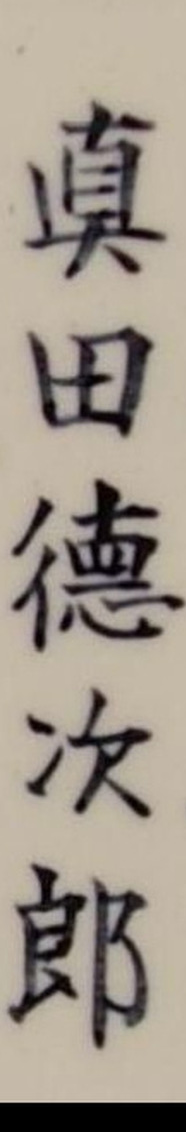真田徳次郎
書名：E~L
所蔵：高野山金剛峯寺
